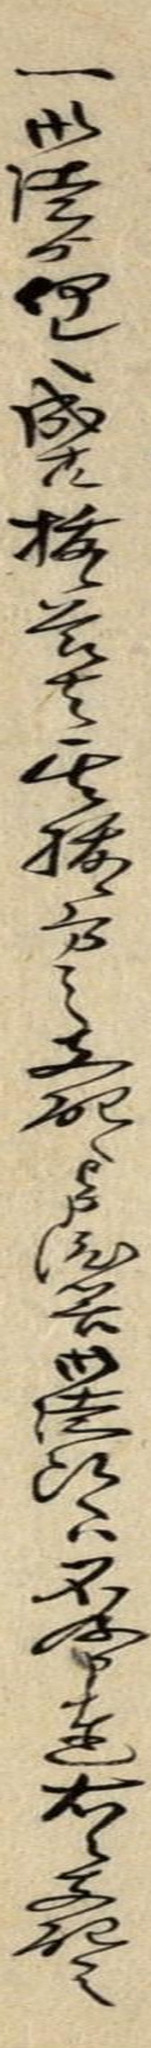一御徒ゟ何れへ成共抜候節は其抜候方之支配へ被申渡候筈御徒頭へは不及申達右之支配之
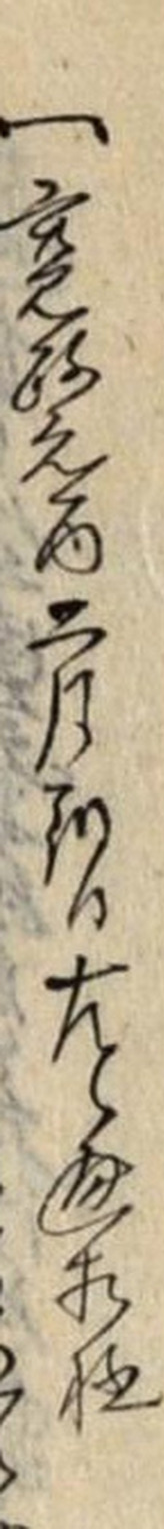一寛政元酉二月朔日左之通相極
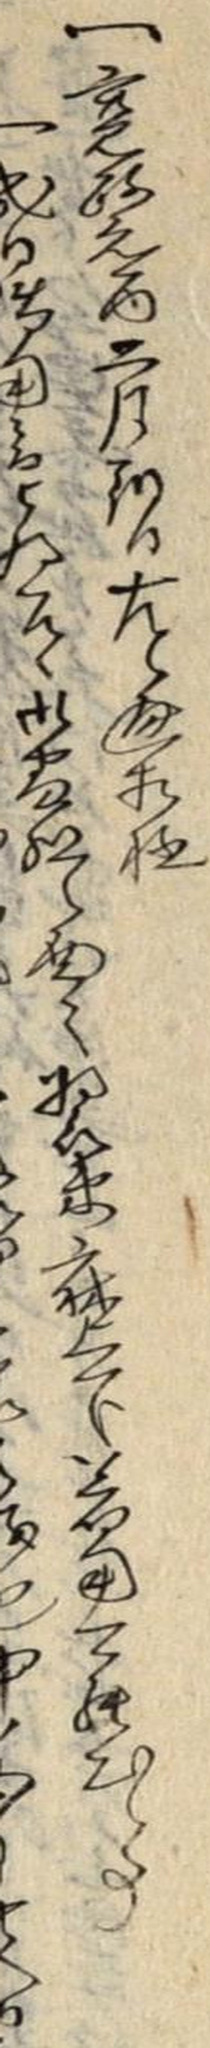一式日御用に而被為召候御番組之面々装束麻上下着用可罷出候事
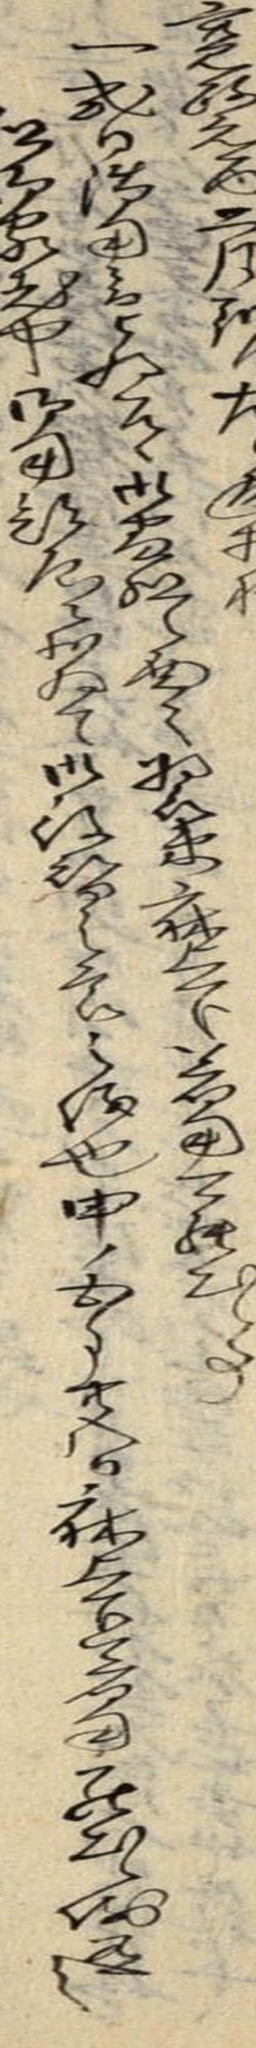但御家老中御用部屋におゐて御役替之節之儀也申ノ五月廿八日麻上下着用罷出候例有之
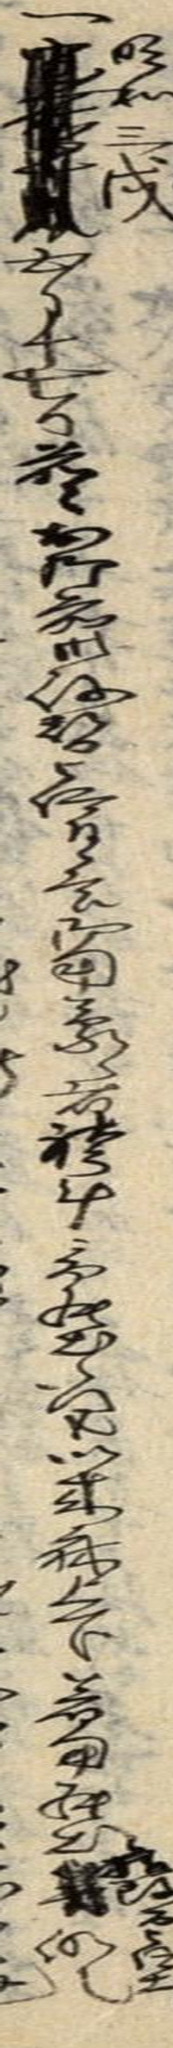一明和三戌五月十七日前々於御前御役替被仰付候節御用蒙候者袴斗に而罷出候得共以来麻上下着用罷出候様改而被仰出候仍之
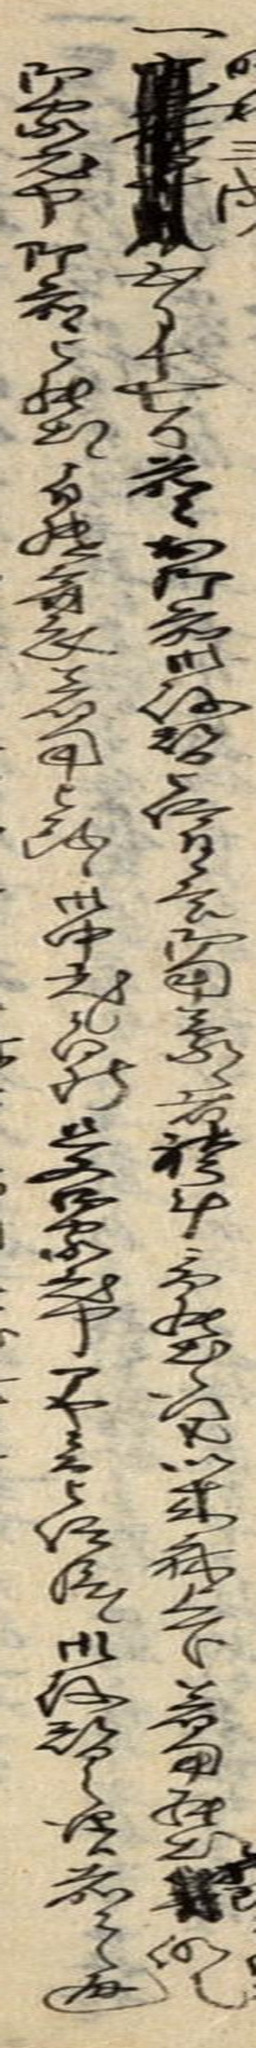御家老中御前へ被罷出候に付継肩衣着用被致候御中老も同断且又御家老中部やに而被仰渡候御役替之儀は前々之通
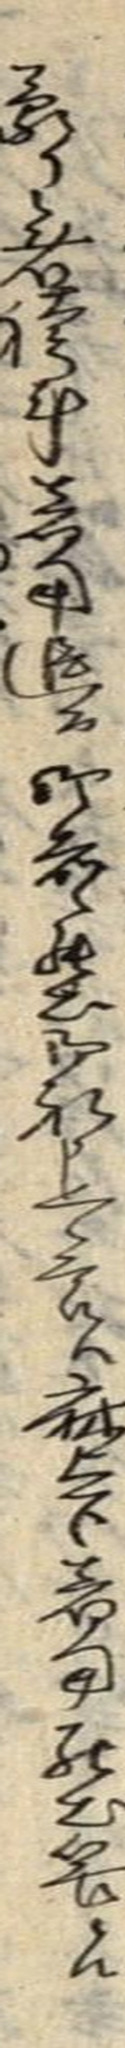蒙り候者袴斗着用追而御前へ罷出御礼申上候節は麻上下着用罷出筈に候
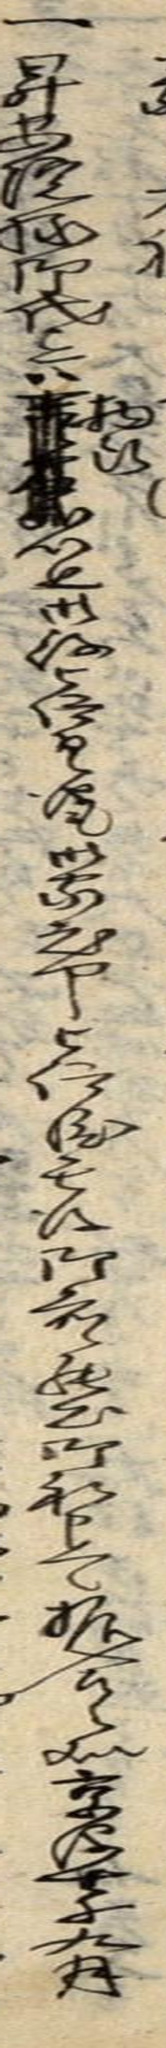一昇安院様御代迄は物頭以上御役被仰付候儀は御家老中被仰渡其後御前へ罷出御礼申上候振合候処享保七寅九月
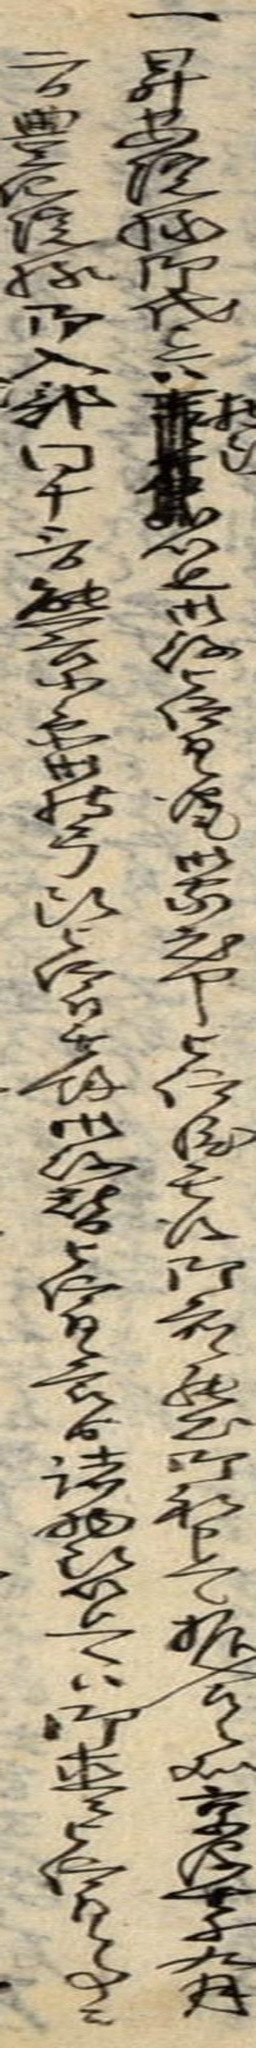二日豊仙院様御入部同十三日熊谷小兵衛御持弓頭被仰付其餘御役替被仰付候節ゟ諸物頭以上へは御直々被仰付候事に
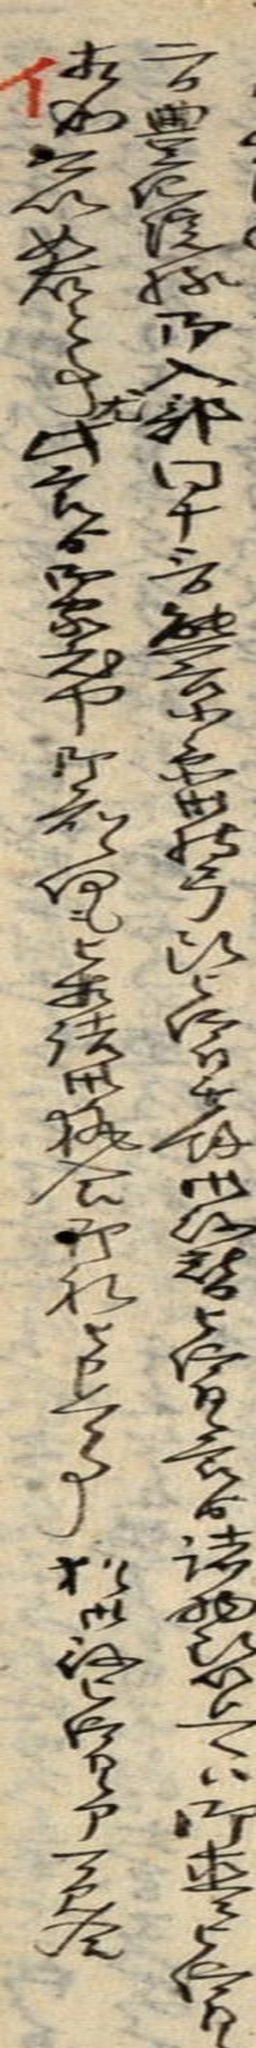相成今以如右に候事尤此節ゟ御家老中御前へ何も被相詰御執合御礼被申上候事猶御役被仰付之部可見合

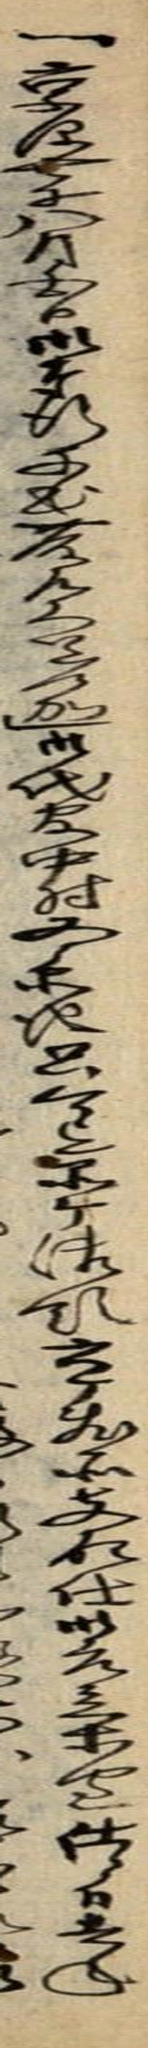一享保七寅八月五日御奉行千本藤左衛門差加」御代官中村又兵衛儀只今迄品ケ瀬領六ヶ敷所支配仕御取立等宜仕候に付去年
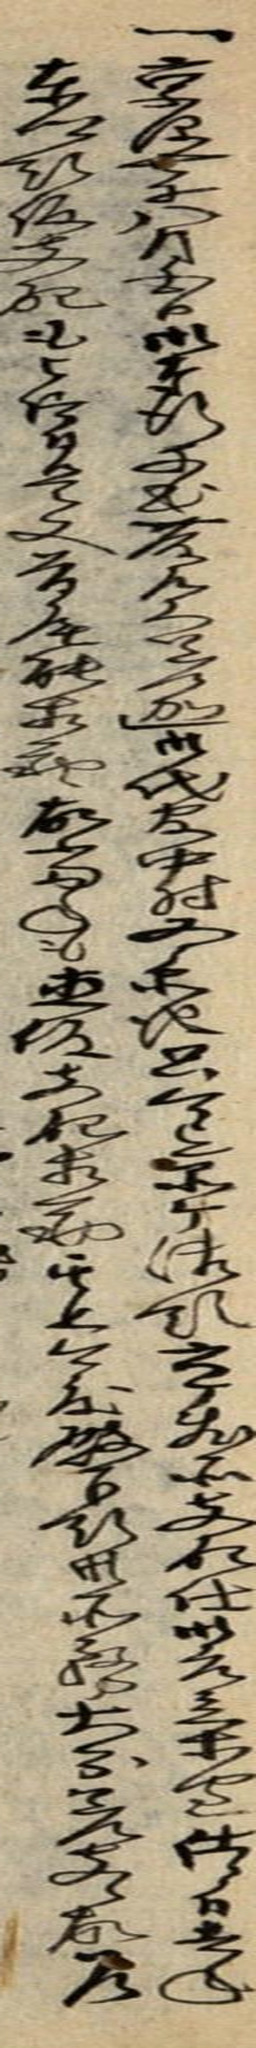東郷領仮支配も被仰付是又首尾能相勤候故当年も直仮支配相勤其上今度殿下領御所務大分差支候故乍
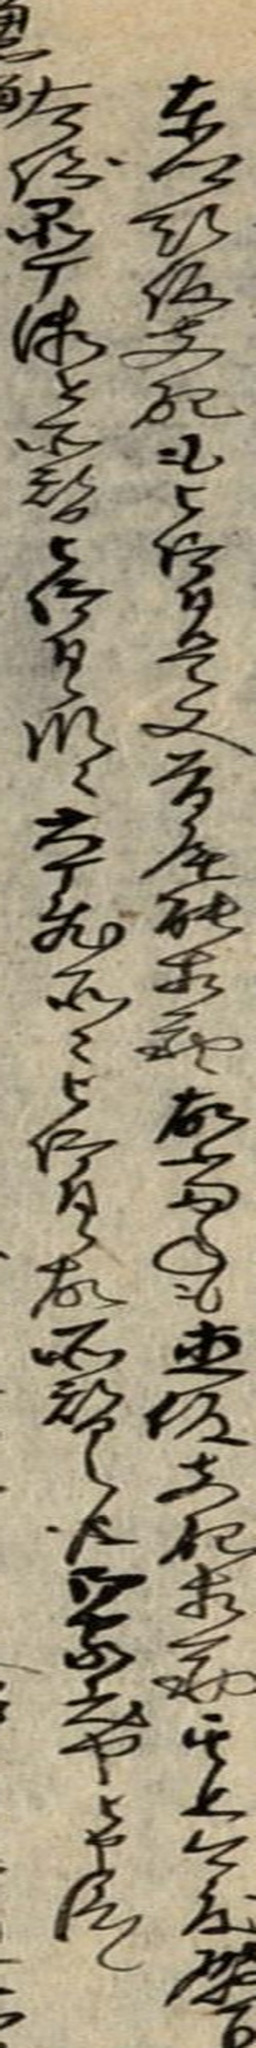大儀品ケ瀬と所替被仰付候段々六ヶ敷所々被仰候故所替之儀御家老中被申渡候
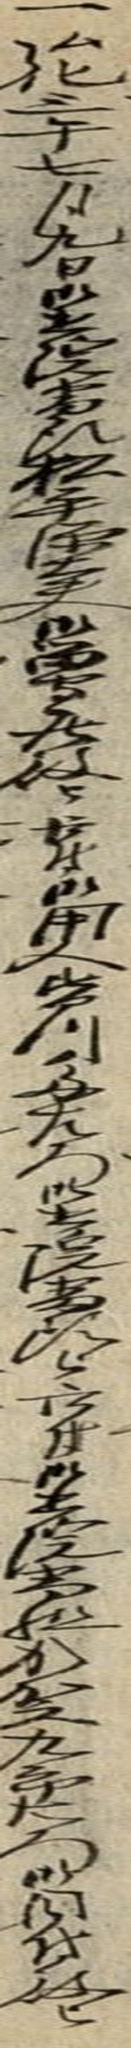一弘化三午七月九日御書院番頭松平源太夫御留守居役被仰付御用人皆川多左衛門御書院番頭被仰付御書院番組加賀九郎右衛門御目付役被

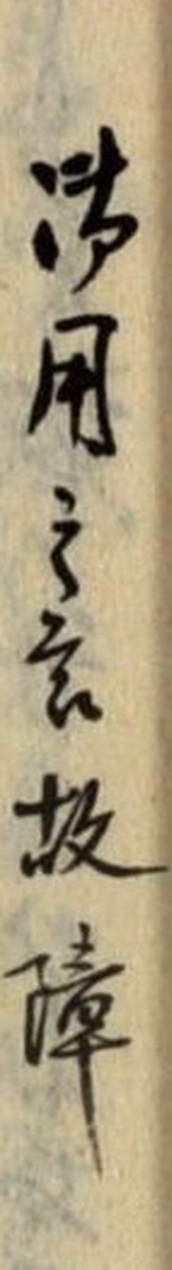御用之節故障
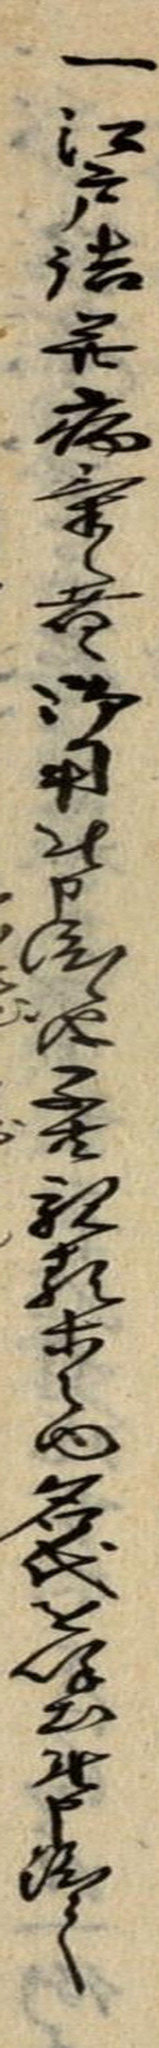一江戸詰并病気之者御用被申渡候儀子共親類等之内名代を呼出被申渡之
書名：御用并被仰出之部
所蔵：福井県文書館 Fukui Prefectural Archives
